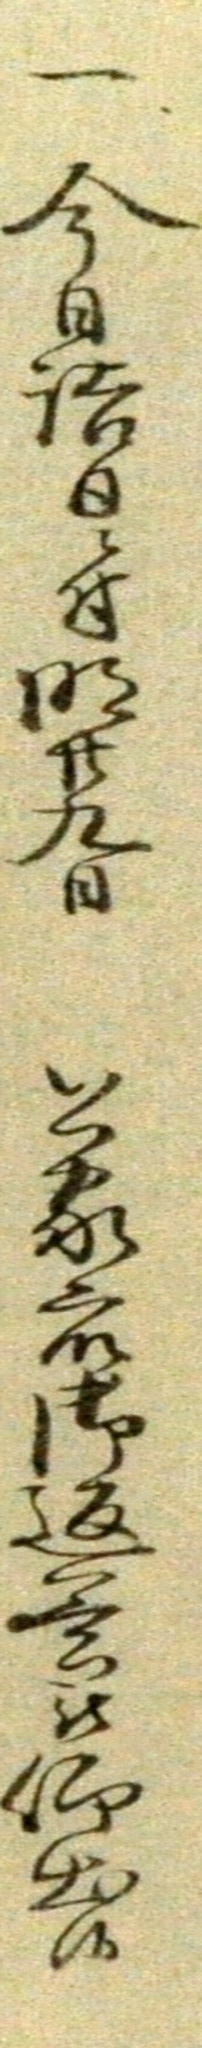一今日詰日ニ付明廿九日公家衆御返答被仰出候
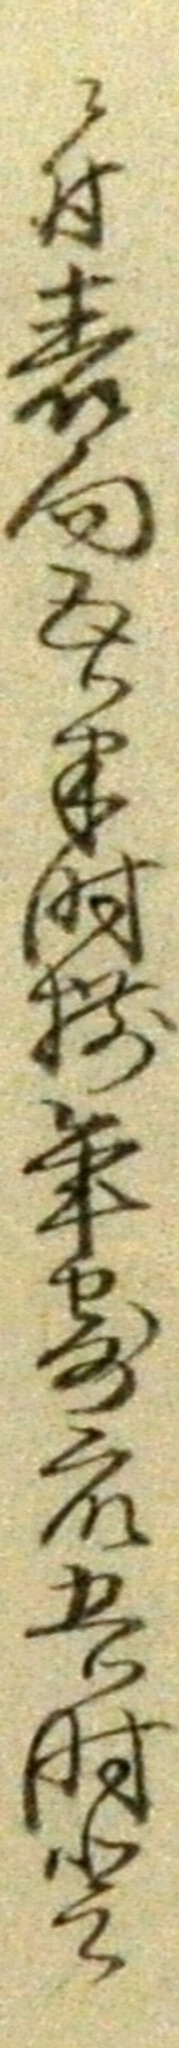ニ付表向五ツ半時揃年寄衆五ツ時登
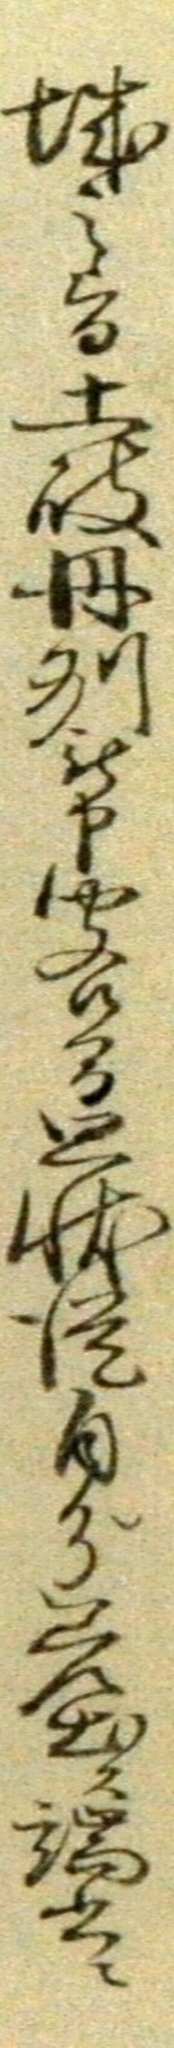城之旨土岐丹州被申聞候間廻状従自分差出ス端書ニ
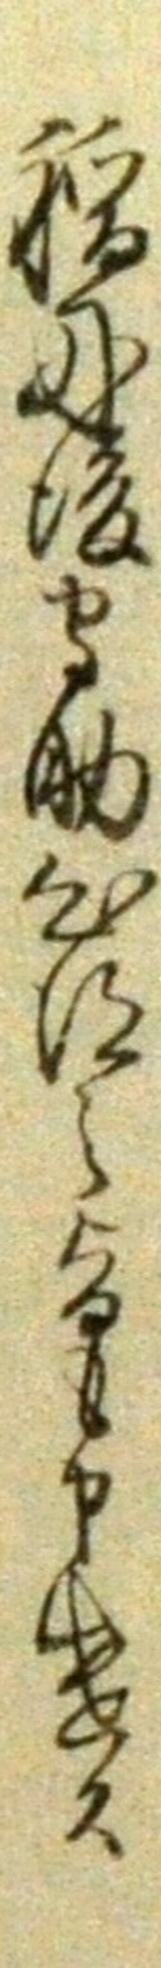稲丹後守助心得之旨も申遣ス

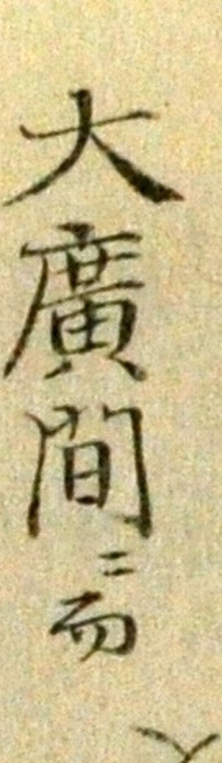大広間ニ而
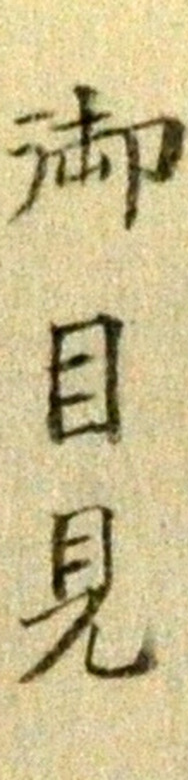御目見
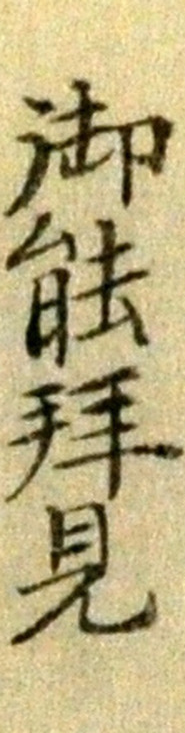御能拝見
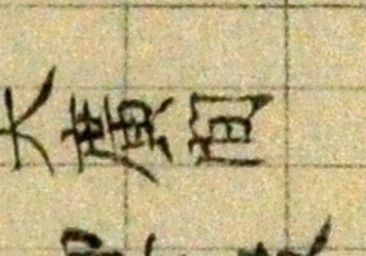大広間
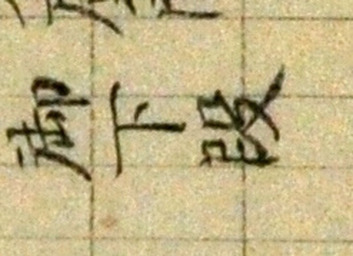御下段
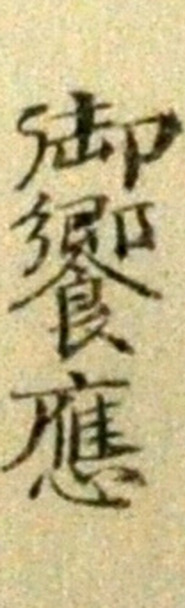御饗応
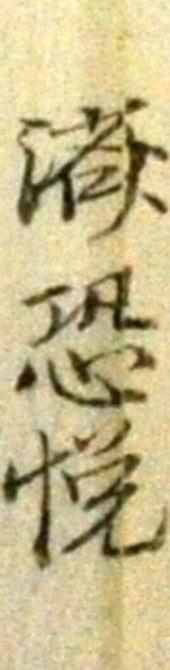済恐悦
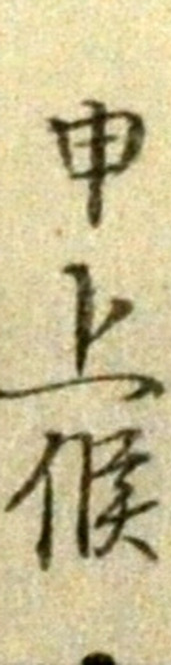申上候

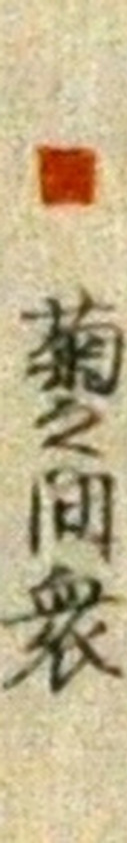菊之間衆
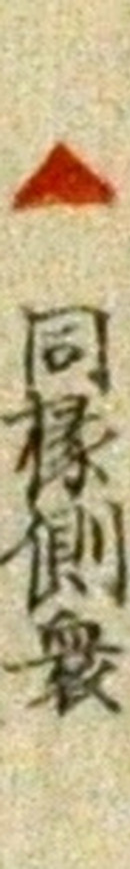同椽側衆
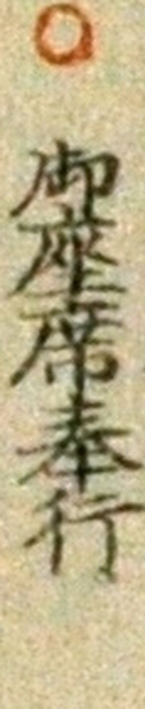御座席奉行
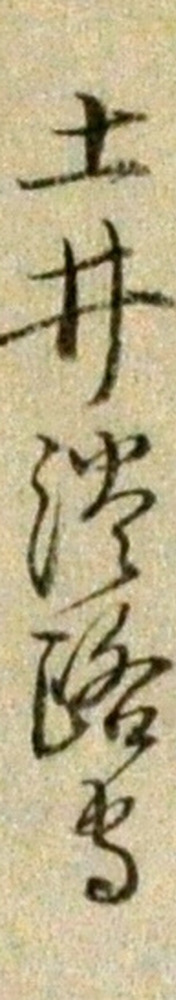土井淡路守
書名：諸留書〔一括〕
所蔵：伊那市立高遠町図書館・合同会社AMANE
